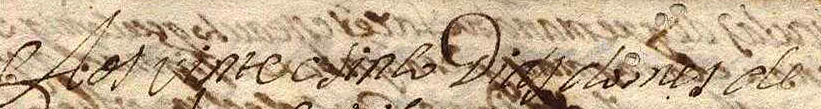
Aos vinte sinco Dias do mes de
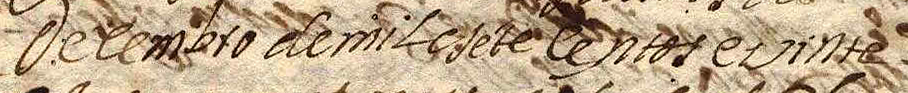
Dezembro de mil e setecentos e vinte
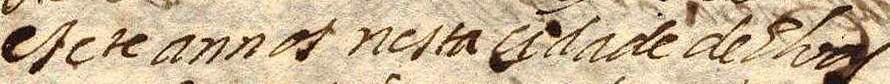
e sete annos nesta cidade de Elvas,
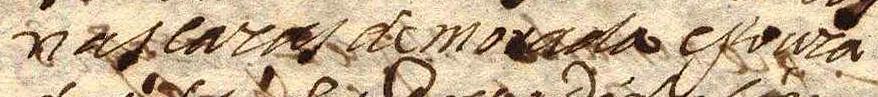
nas cazas de morada e pouza
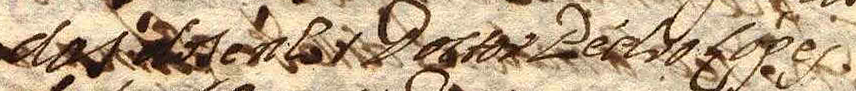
das do senhor Doctor Pedro Lopes
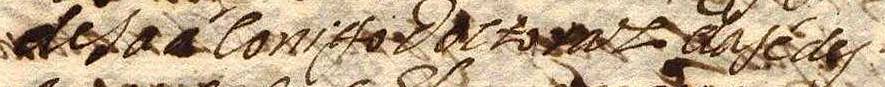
de saá conigo doctoral da sé des
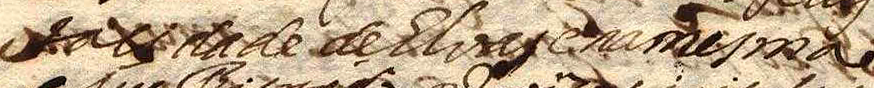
ta cidade de Elvas e na mesma
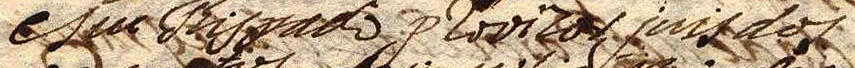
e seu Bispado pRovizor juis dos
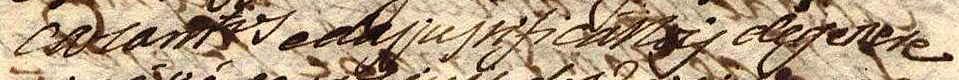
cazamtos e das justificassois de genere
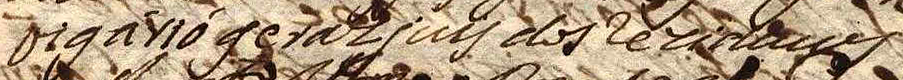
vigario geral juis dos Reziduos
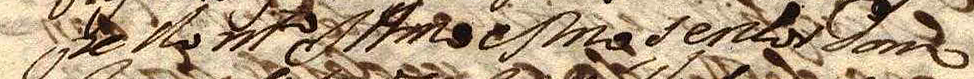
pello mto Jllmo e Rmo senhor Dom
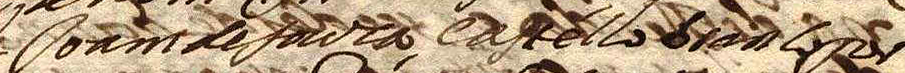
Joam de souza castello branco por
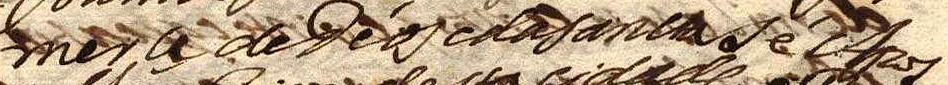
merce de Deos e da sancta se Apos
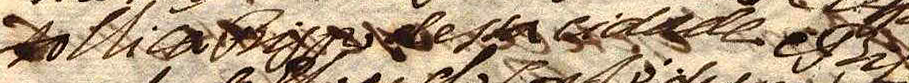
tollica Bispo desta cidade e Bis
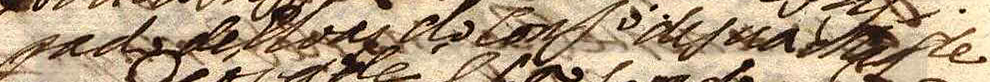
pado de Elvas do conso de sua Magde
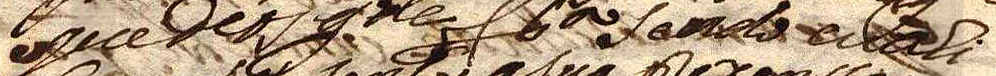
que deos g.de &ra sendo eu ahi
